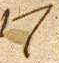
17
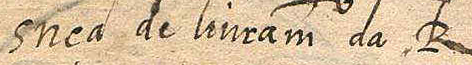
snçā de liuramto da R
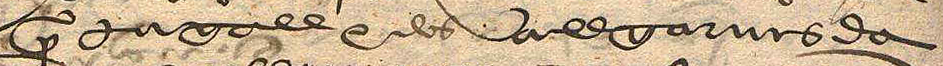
p̄otugall e dos allgarues da
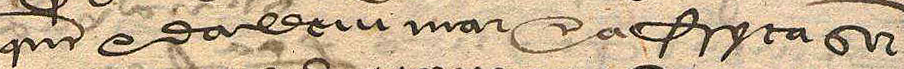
quē e dallem mar ē afryca s̄or
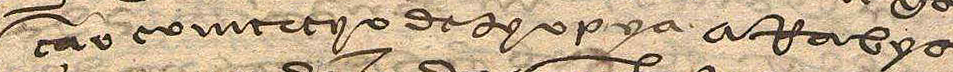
ção comercyo detyopya aRabya
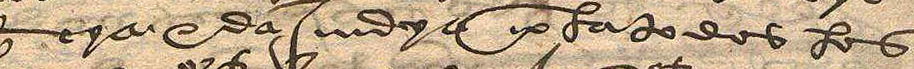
p̄cya e da Jmdya c̄ꝭ ha todos hos
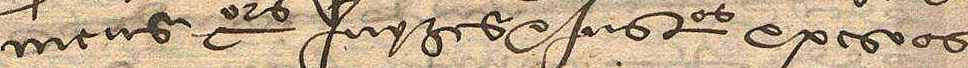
meus Cors Juyzes e Justas e pesoas
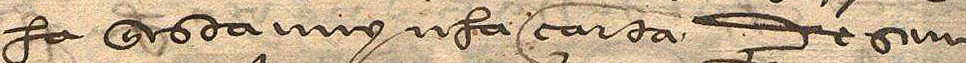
ha q̄ esta mynha carta de sem
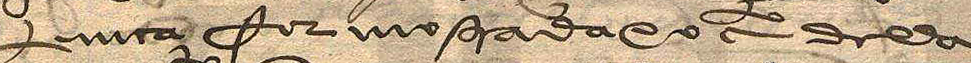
temça for mostrada e o cto della
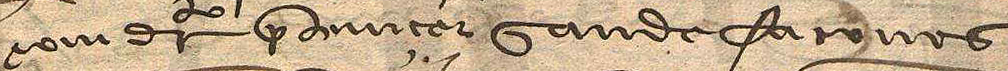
com drto p̄temcer Saude faco uos
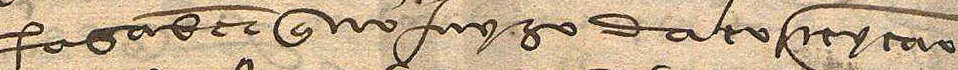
ha saber q̄ no Juyzo da correyção
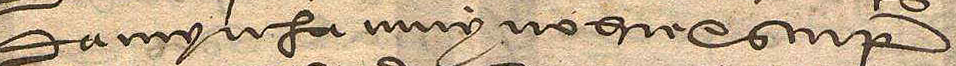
da mynha muy nobre e semp̄
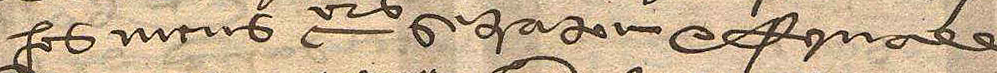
hos meus cors se tratou e fynall
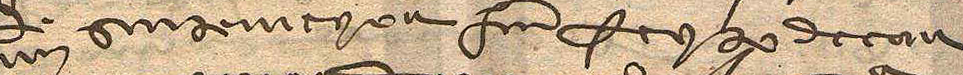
mte sentemcyou hū feyto de cau
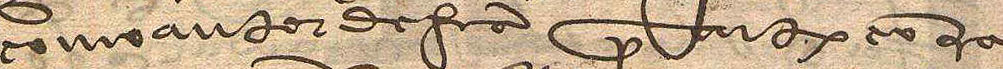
como autor de huā p̄artꝭ cōtra
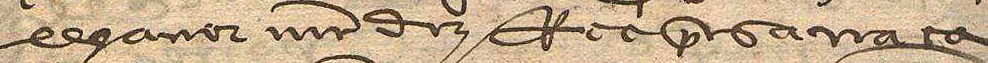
llyanor mēdez Ree p̄sa na ca
